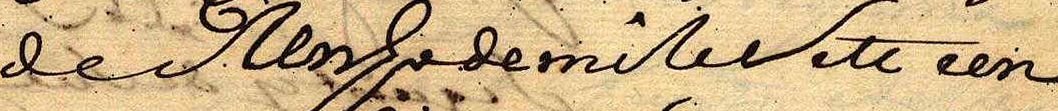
de Iunho de mil, e Setecen
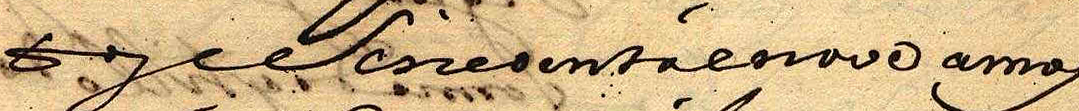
tos e Sincoenta, e nove annos
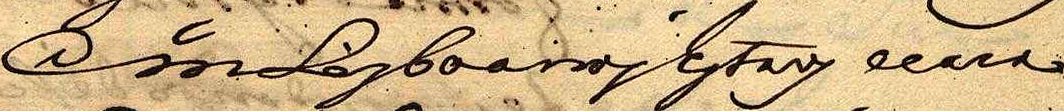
em Lisboa nos Estaos, e caza
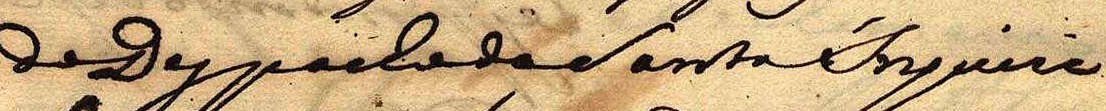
do Despacho da Santa Inquizi
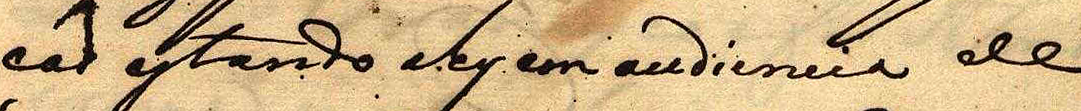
çaõ estando ahy em audiencia de
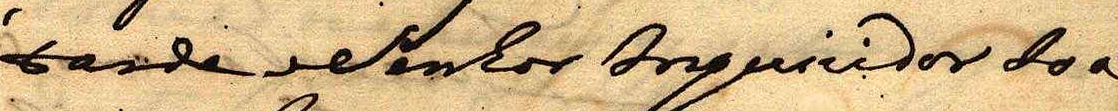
tarde o Senhor Inquizidor Ioa
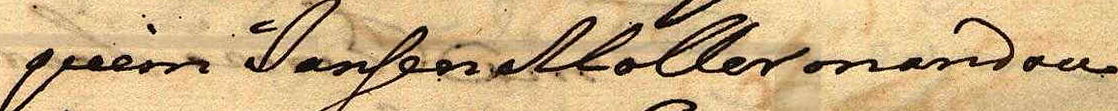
quim Iansen Moller mandou
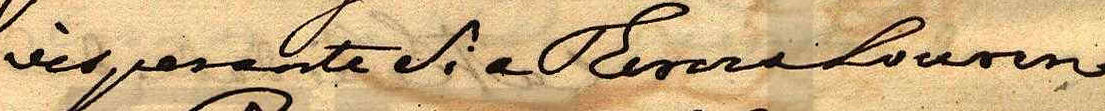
vir perante Si a Thereza Louren
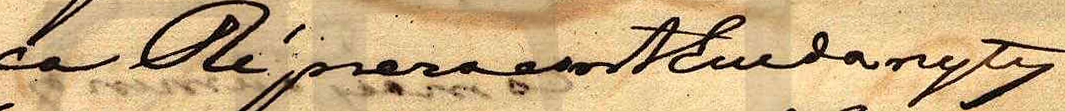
ça Ré preza contheuda nestes
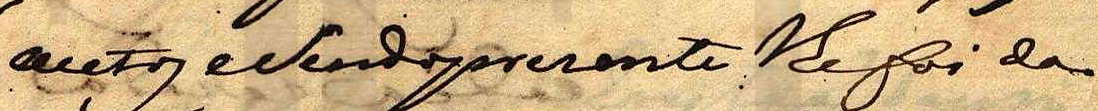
autos, e Sendo prezente lhe foi da
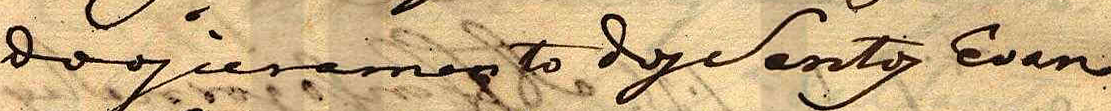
do o juramento dos Santos Evan
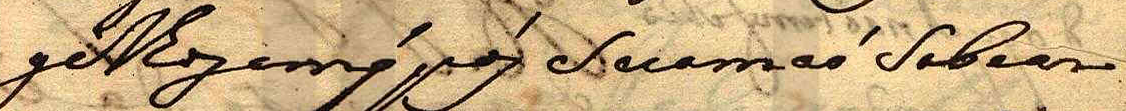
gelhos em q̄ pos Sua maõ Sob car
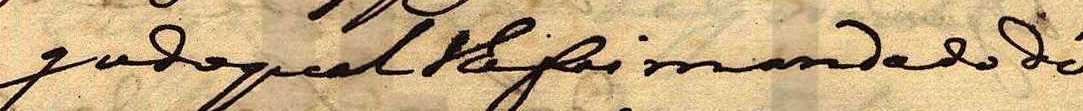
go do qual lhe foi mandado di
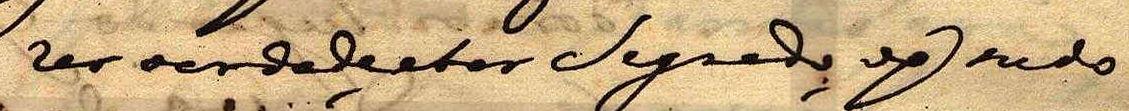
zer verdade e ter Segredo, o q̄ tudo
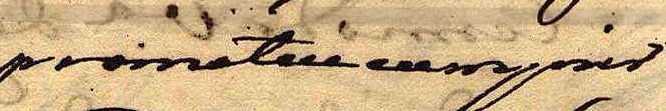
prometeu cumprir
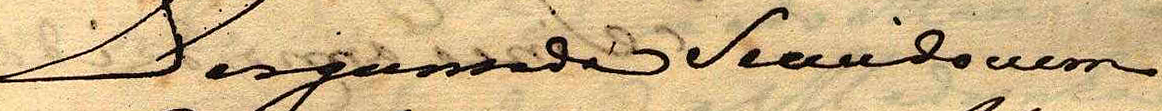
Perguntada Se cuidou em
